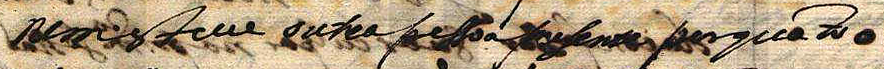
nem esteue outra pessoa presente porquāto o
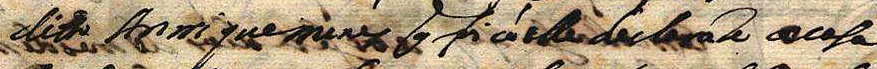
ditto Anrrique nunes q̄ foi cō elle declarāte a casa
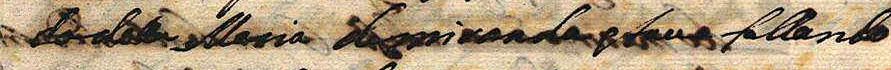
da ditta Maria de miranda estaua fallando
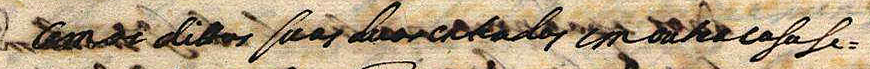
com as dittas suas duas enteadas em outra casa se
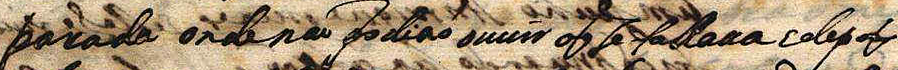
parada onde naõ podiaõ ouuir o q̄ se fallaua E depois
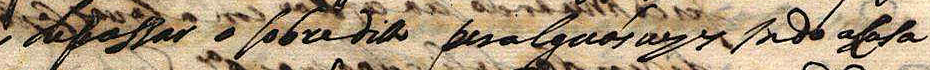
de passar o sobreditto per alguas̄ uezes Indo a Casa
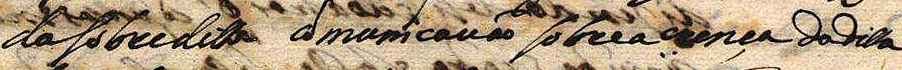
da sobreditta cōmunicauaõ sobre a crença da ditta
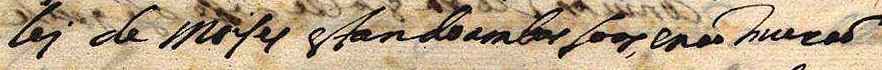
lej de moises estando ambos soos, e naõ tiueraõ
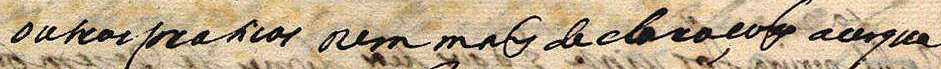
outras praticas nem mais declaraçoẽs acerqua
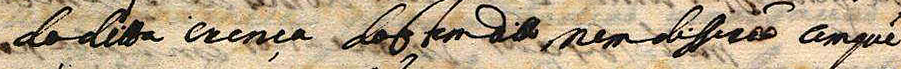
da ditta crença do q̄ tem ditto nem disseraõ com quē
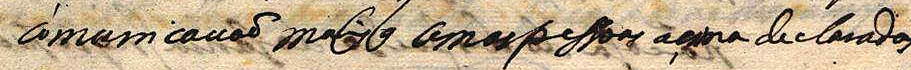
cōmunicauaõ mais q̄ com as pessoas açima declaradas
